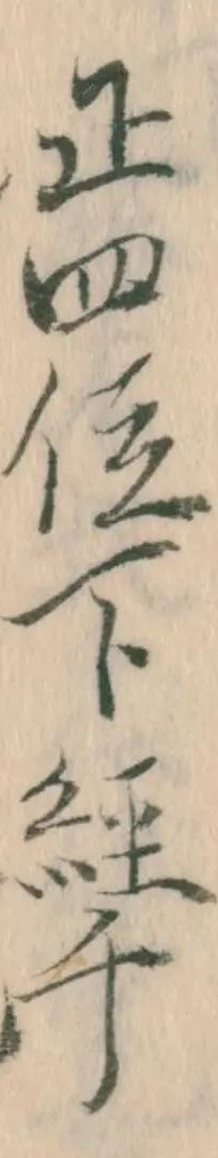正四位下経千
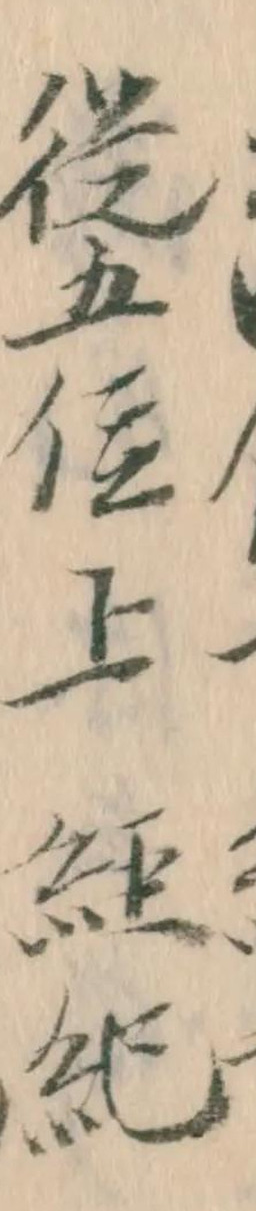従五位上経紀
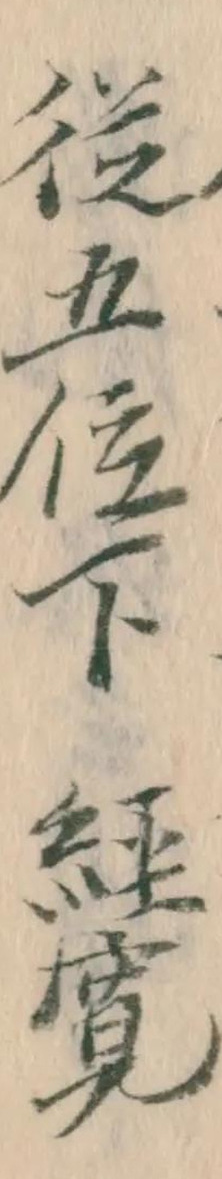従五位下経寛
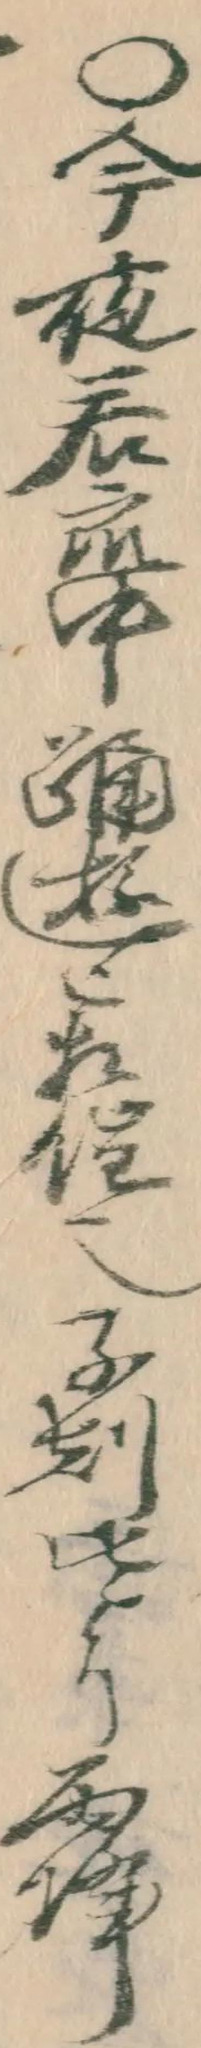○今夜若衆中踊遊被相催也子刻比より雨降
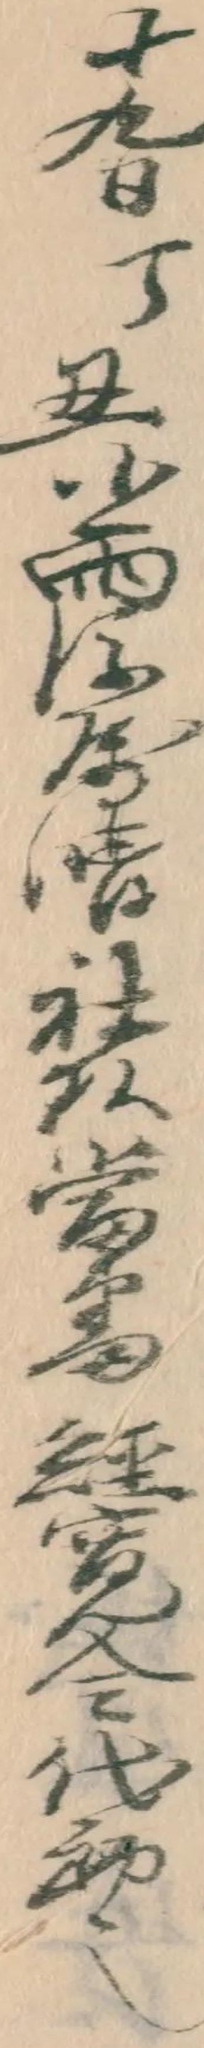十九日丁丑小雨属晴社頭當番継令代勤也
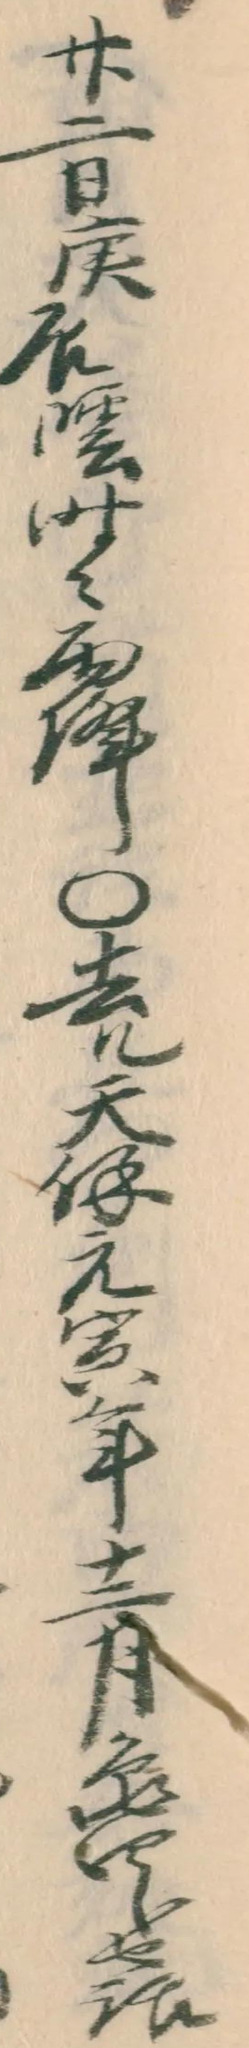廿二日庚辰曇時々雨降○去ル天保元寅年十二月亀四郎世話
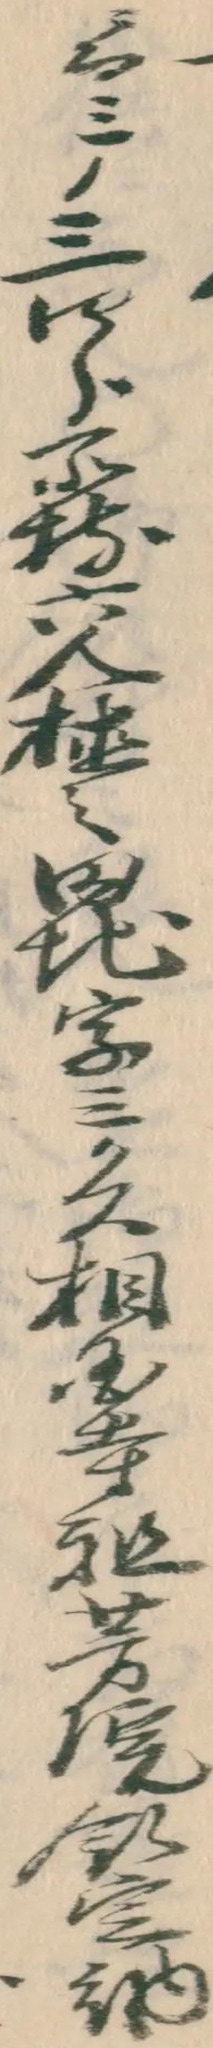ニ而三ノ三四郎所持六人植之田地字三クス相国寺祖芳院領定納
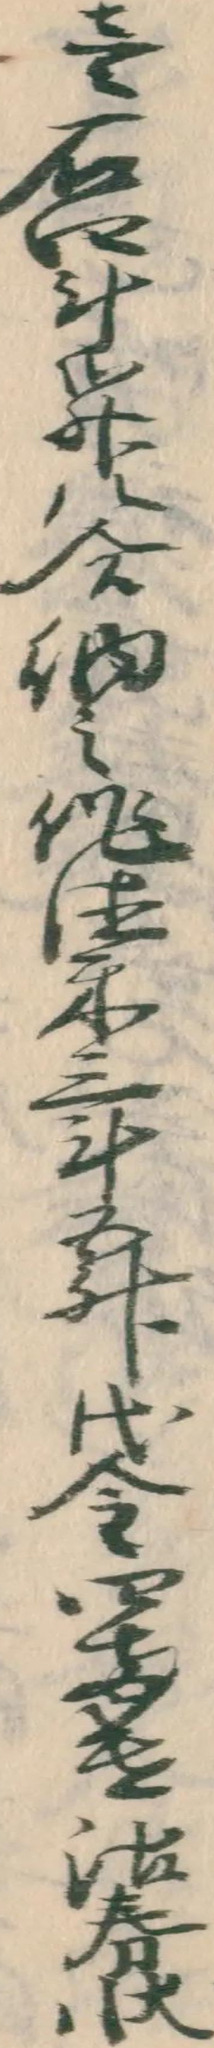壱石四斗弐升八合納之作法米三斗五升代金四両遣沽券状
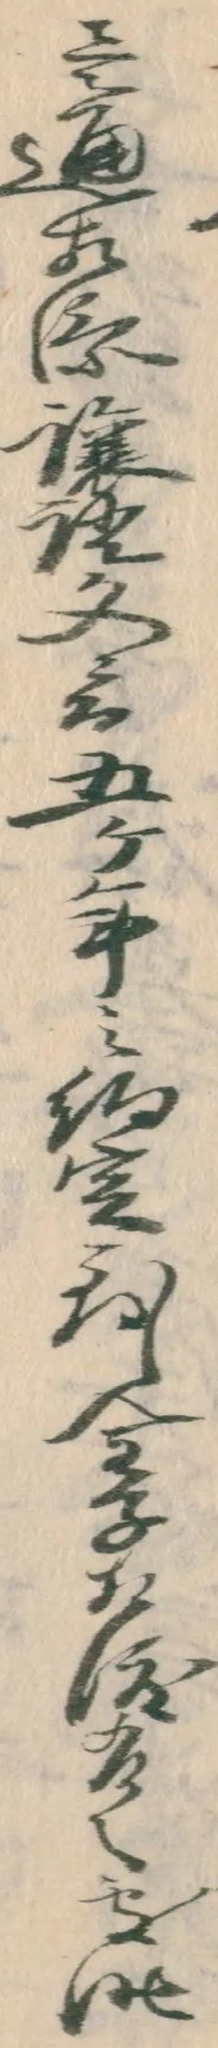壱通相添譲證文ニ而五ケ年之約定致し金子相渡有之處昨
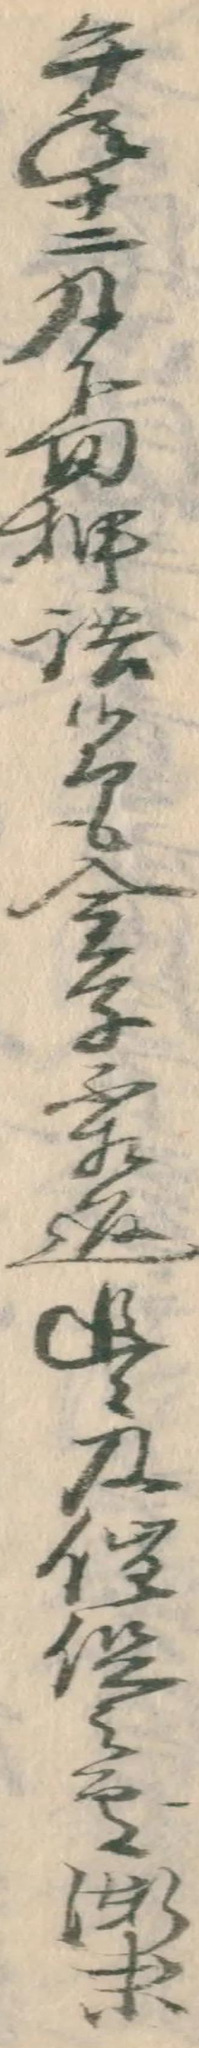午年十二月下旬押詰候而も金子不相返追々及催促之處漸末
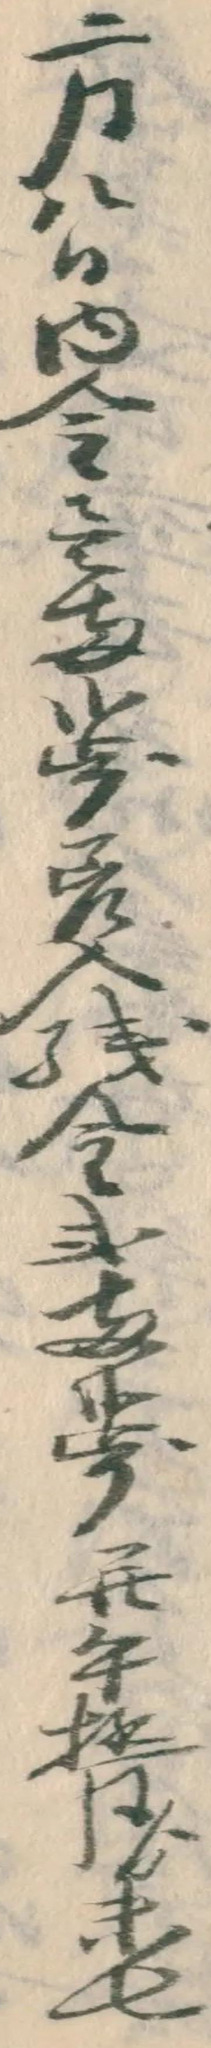二月八日内金壱両弐歩差入残金弐両弐歩并午植月ゟ末七
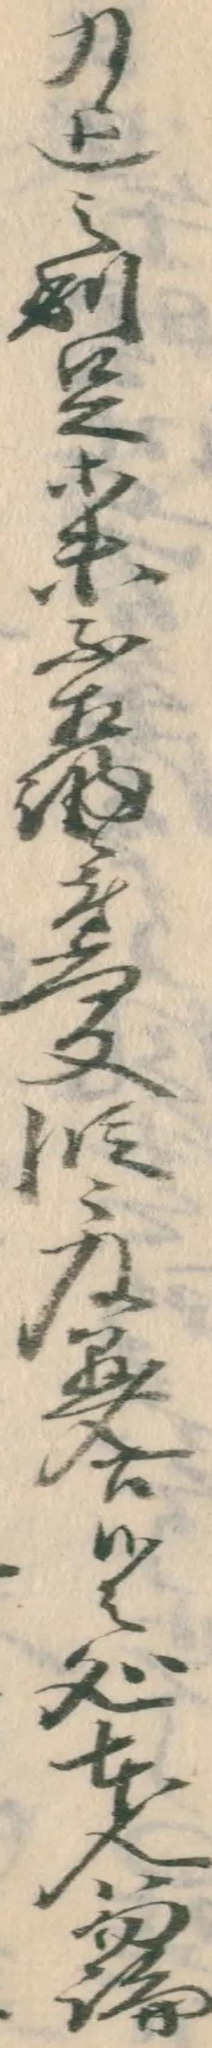月迄之別足等未不相納ニ付尚又段々及懸合候之処本人ハ勿論
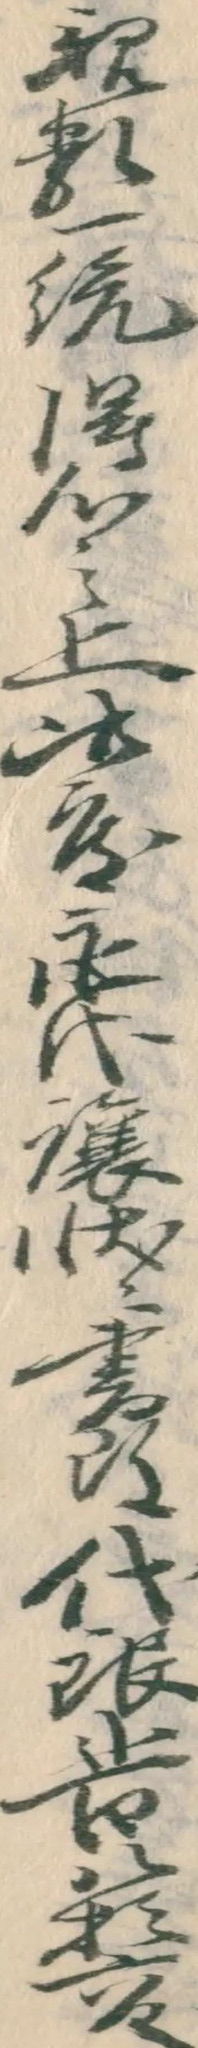親類一統得心之上此度永代譲状に書改代銀弐百八拾六匁
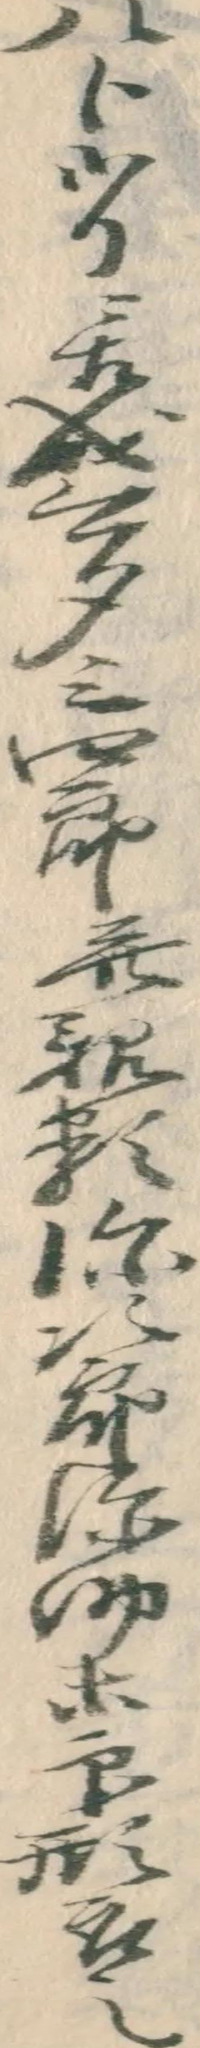八分弐りニ相成今夕三四郎并親類弥次郎源助等印形取之
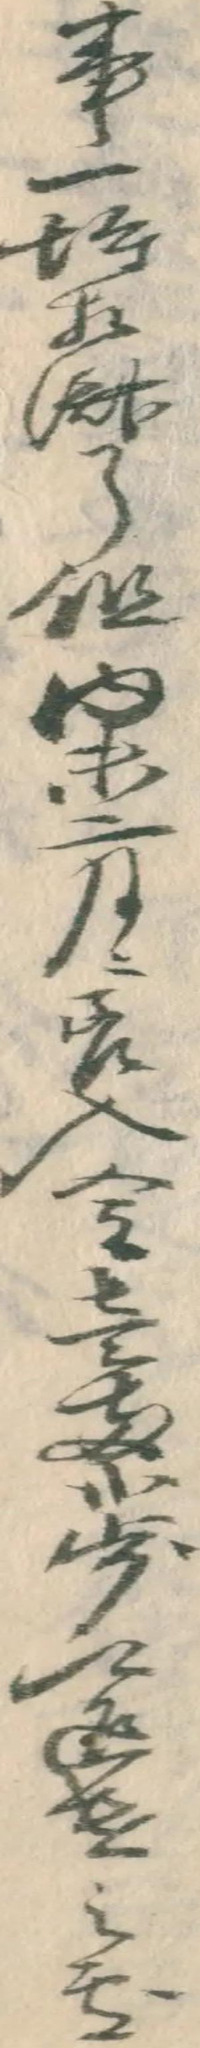事一坪相済了但内未二月ニ差入金壱両弐歩九厘遣之處
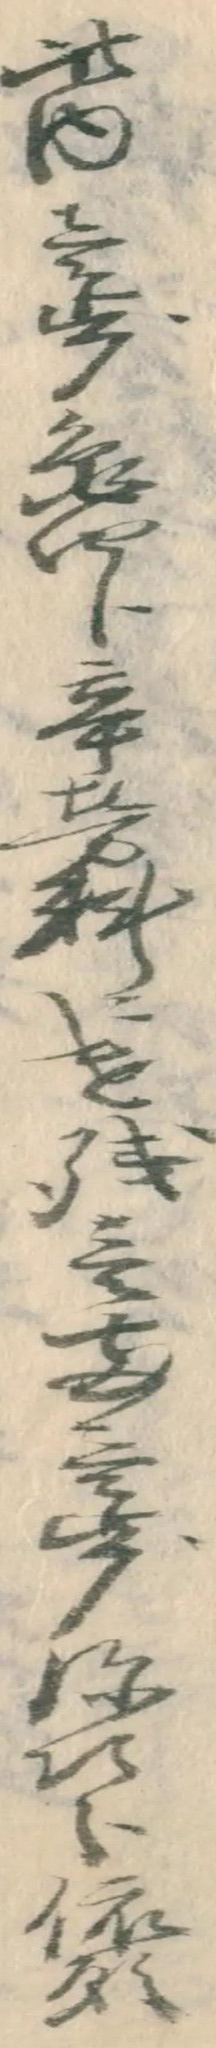此内壱歩亀四郎辛労料に遣残壱両壱歩弥次郎依願
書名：賀茂社記録. 第67冊
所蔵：国立国会図書館 National Diet Library, JAPAN
